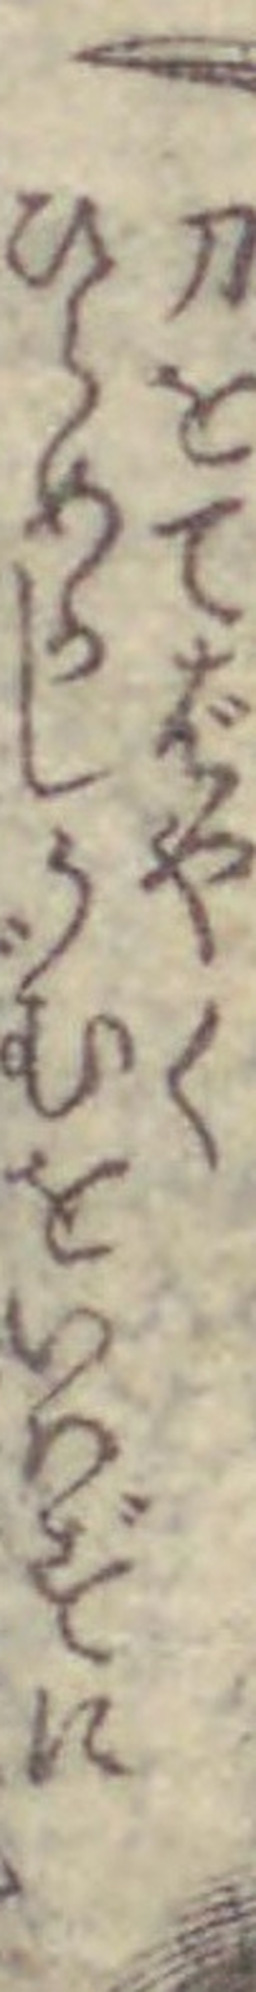ひらめかしうむをいわずに
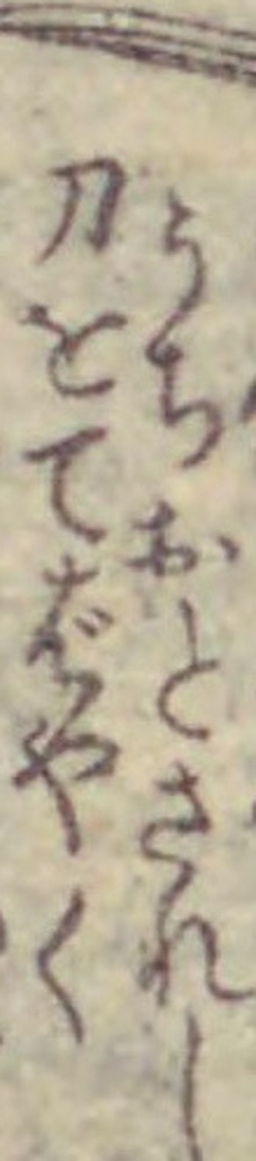刀をてばやく
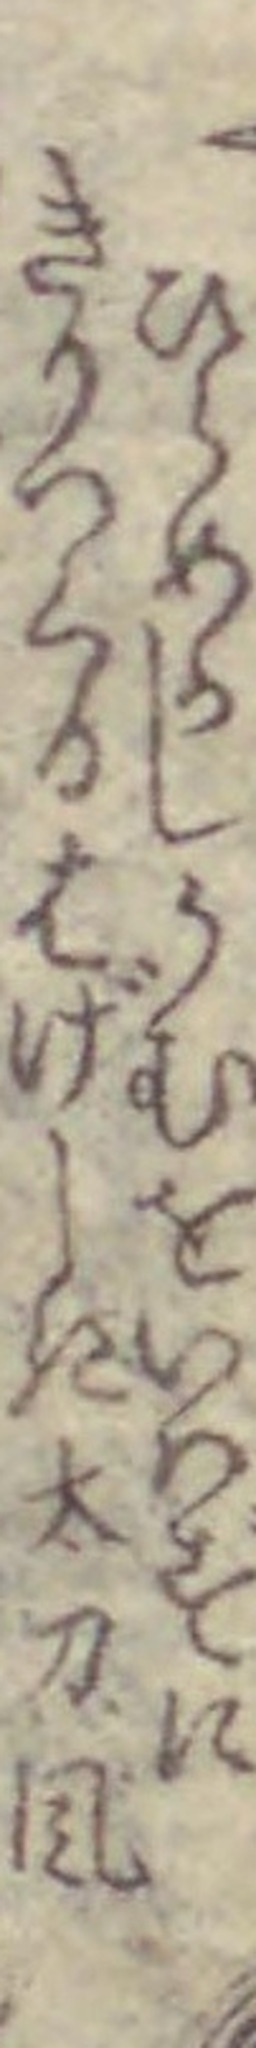きりつくるはげしき太刀風
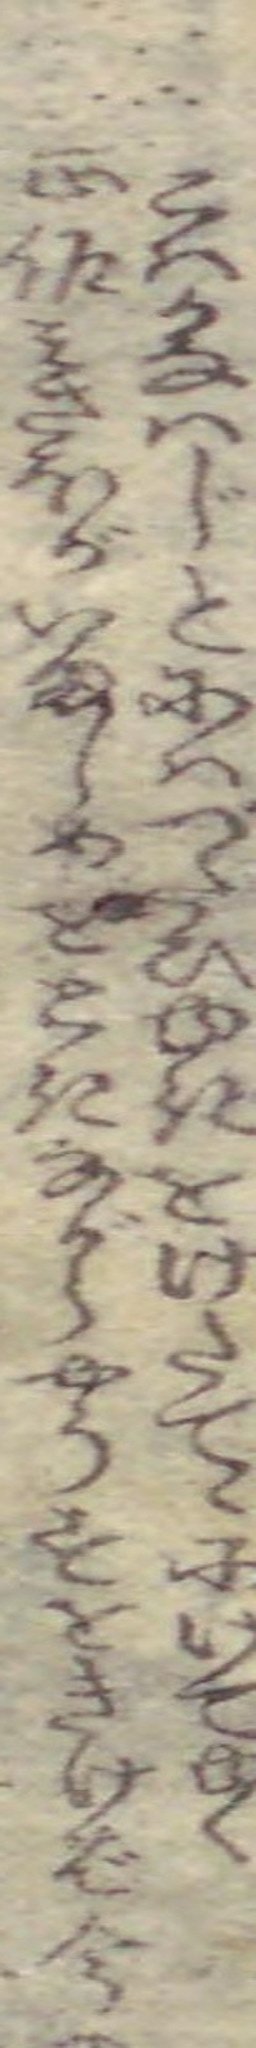正作みさほがいましめをときながらやうすをきけば今のは
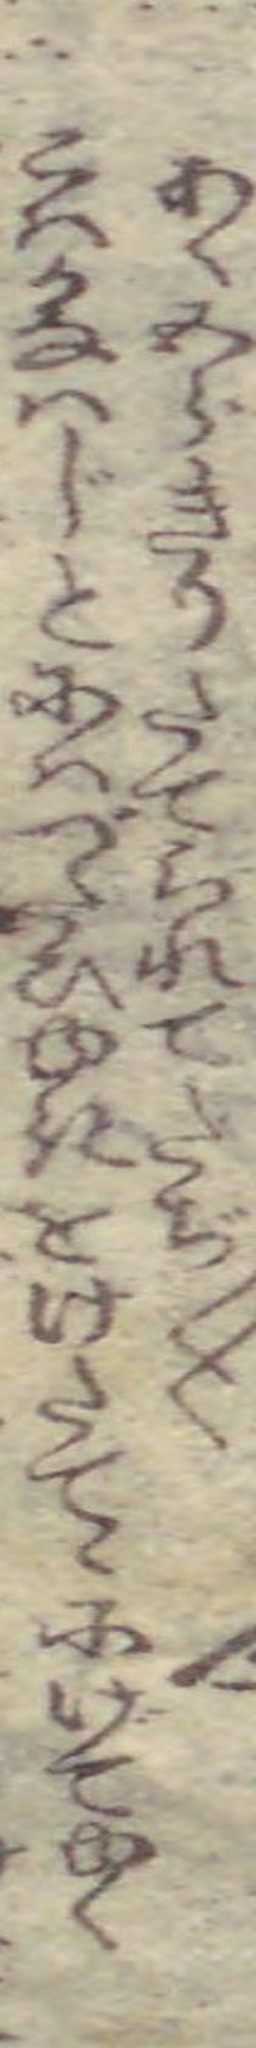こはかなはじとにはづたひゆきをけたてゝにげてゆく
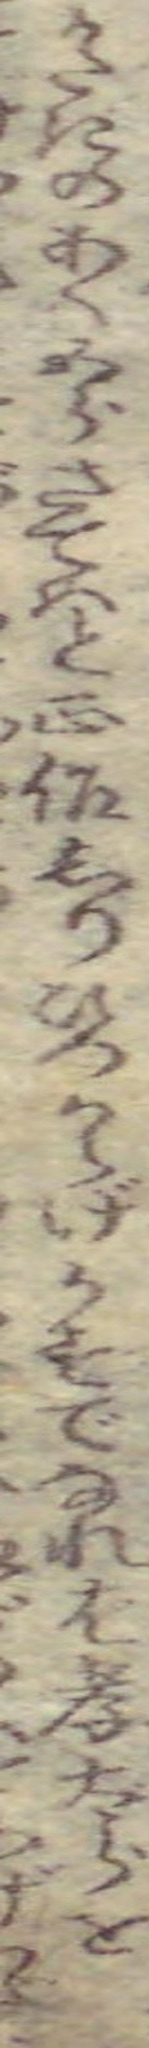かたきのあく五郎さてはと正作しりひつからげうすでなれば孝太郎を
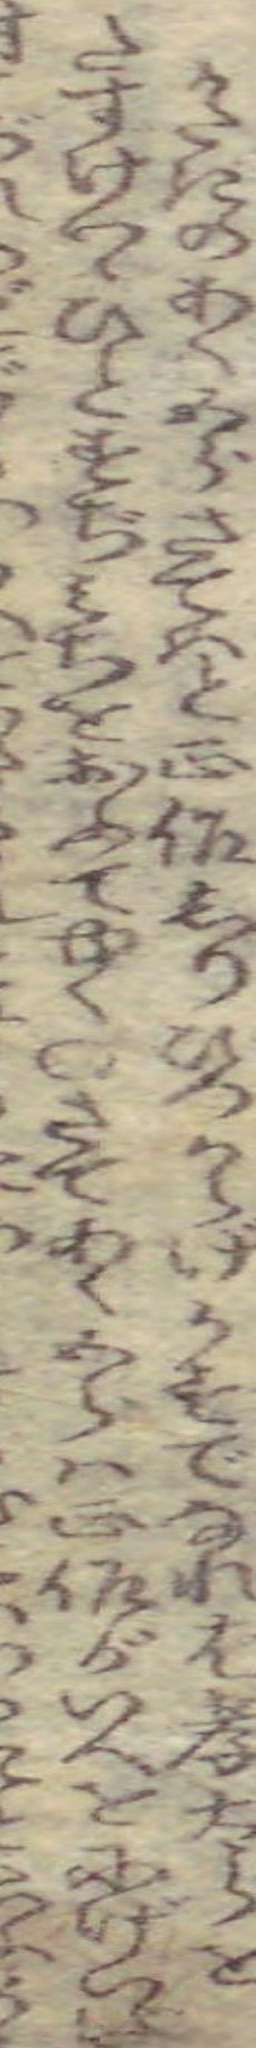たすけつゝひとすじみちをおふてゆく○さてあく五郎は正作がいへをにげいたし

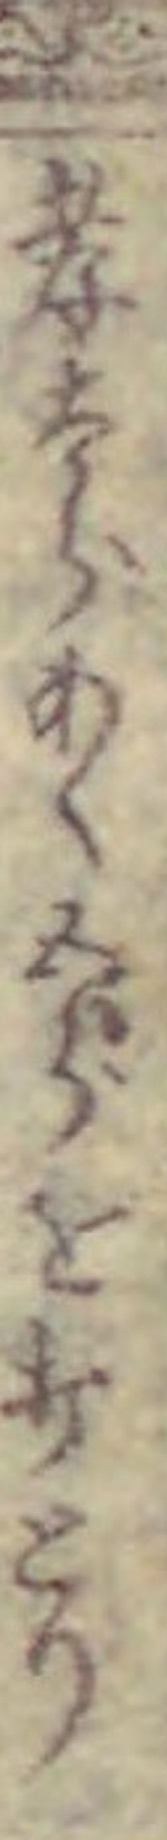孝太郎あく五郎を打とり
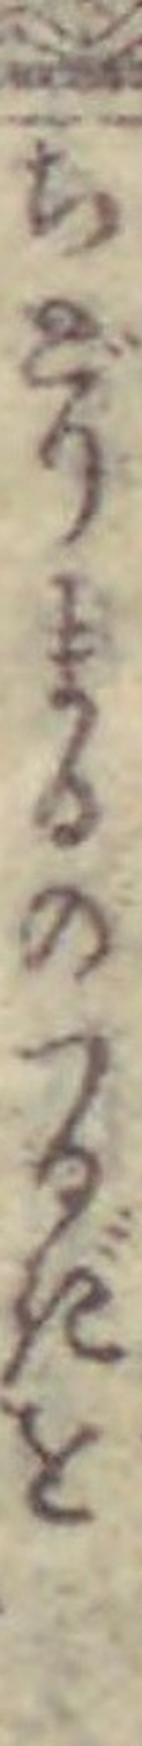ちどりまるのつるぎを
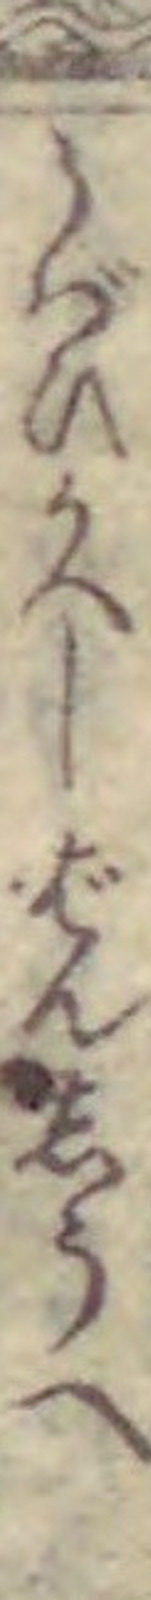うばひかへしばんしうへ
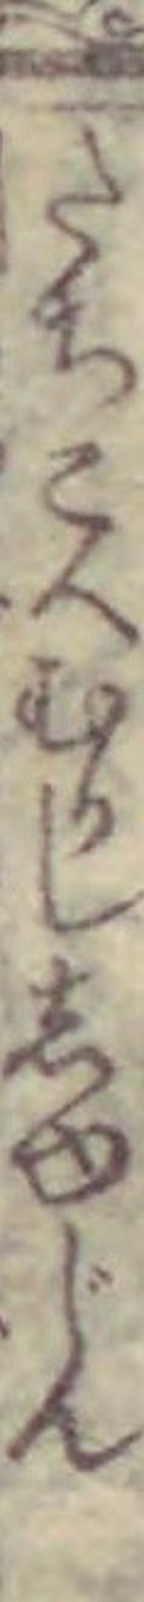たちこへむかししゆじん
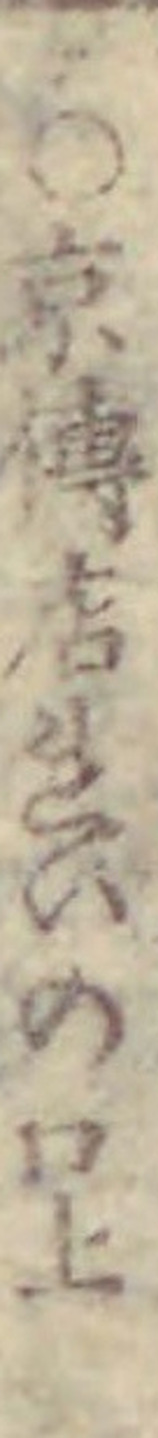○京傳店れいの口上
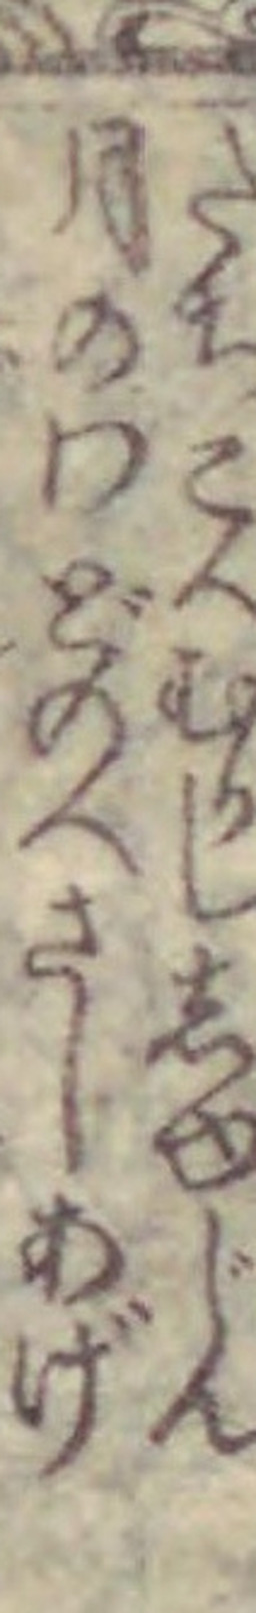月のわどのへさしあげ
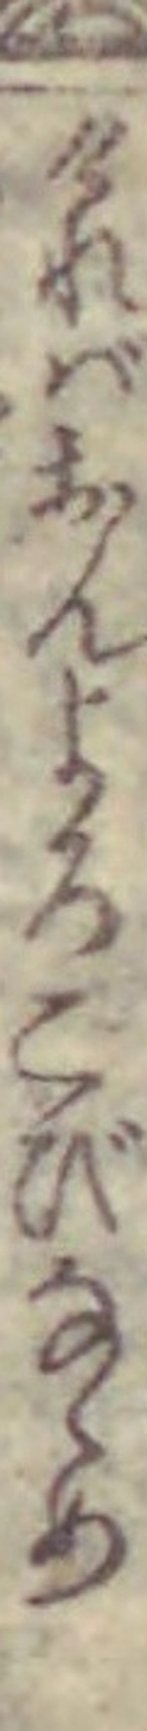ければおんよろこびなゝめ
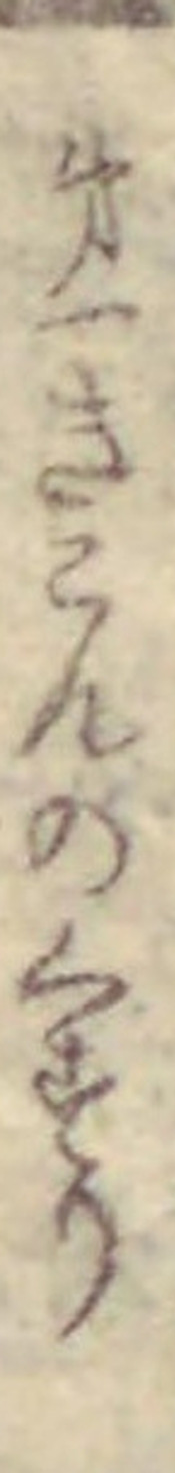第一きこんのくすり
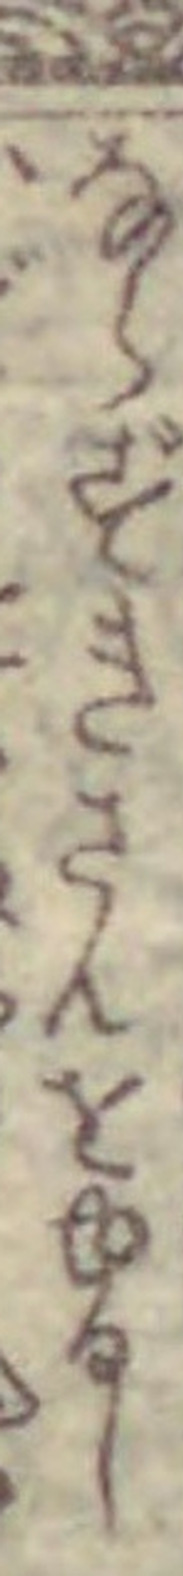ならずきさんをゆるし
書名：八ツ目鱣因縁物語 3巻
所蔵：国立国会図書館 National Diet Library, JAPAN
